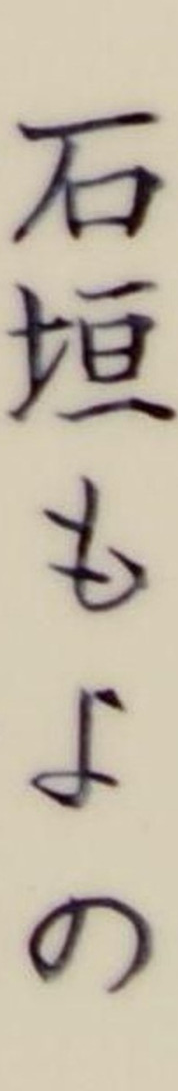石垣もよの
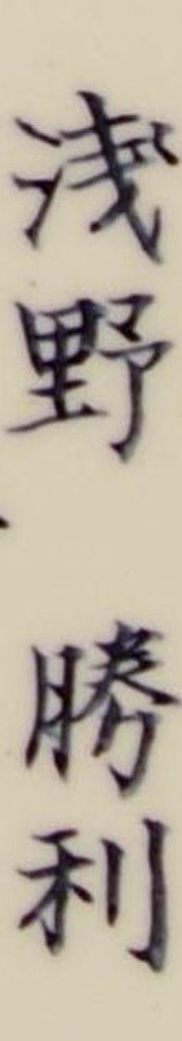浅野勝利
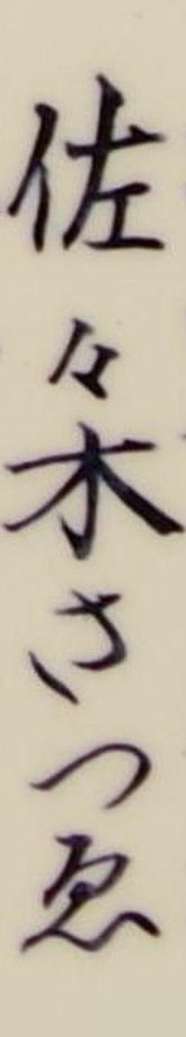佐々木さつゑ
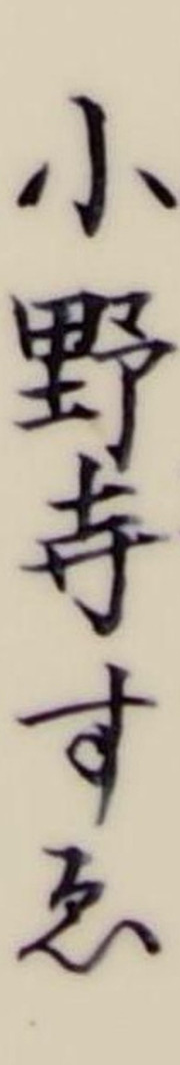小野寺すゑ
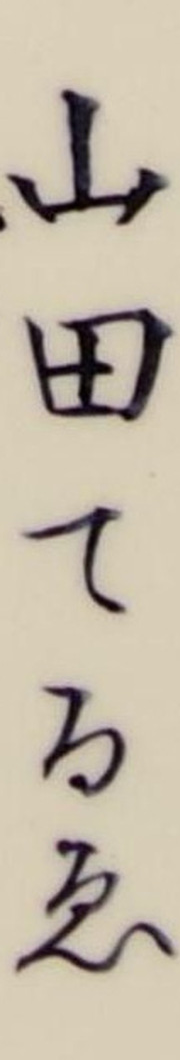山田てるゑ
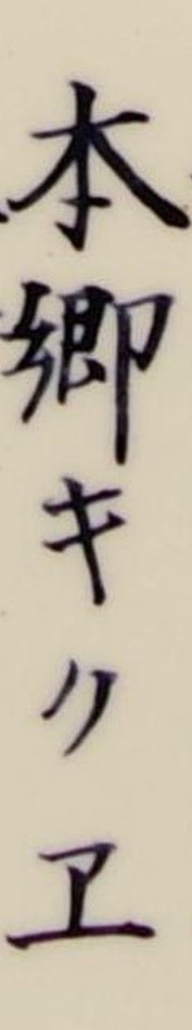本郷キクヱ
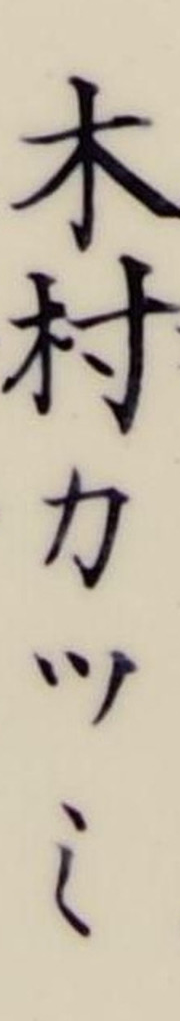木村カツミ
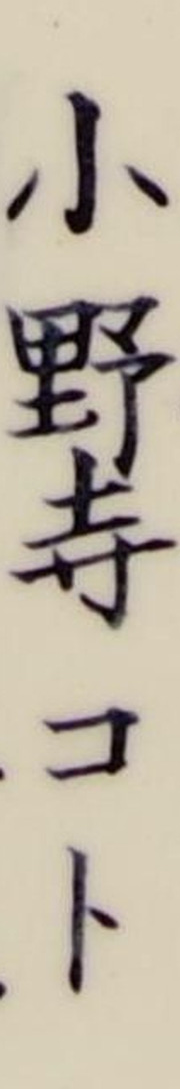小野寺コト
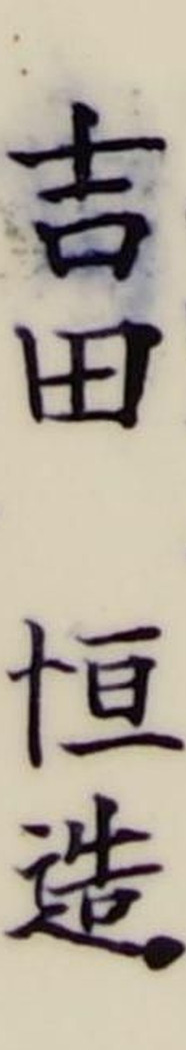吉田恒造
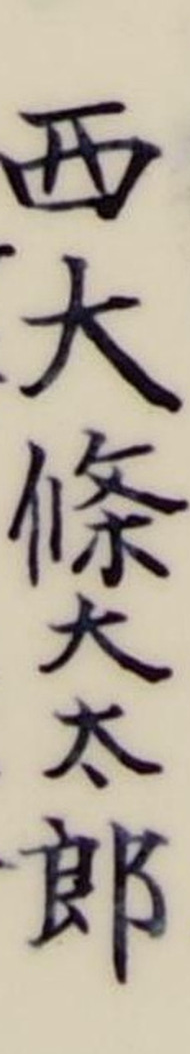西大條大太郎
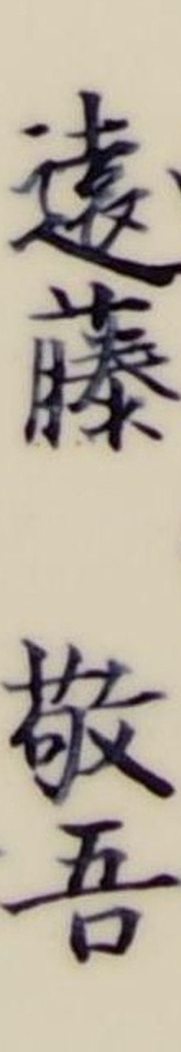遠藤敬吾
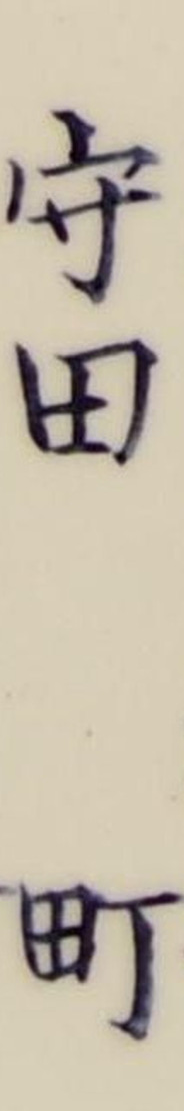守田町
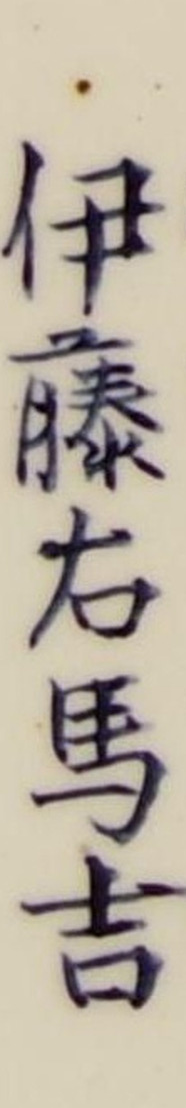伊藤右馬吉
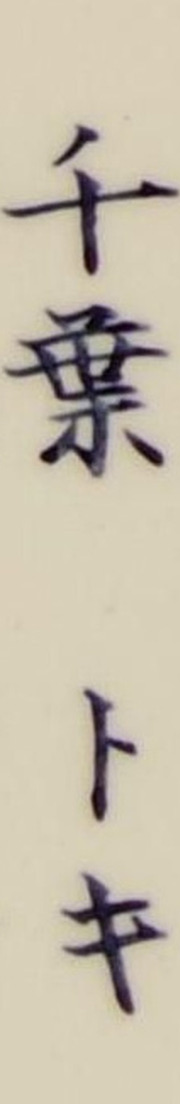千葉トキ
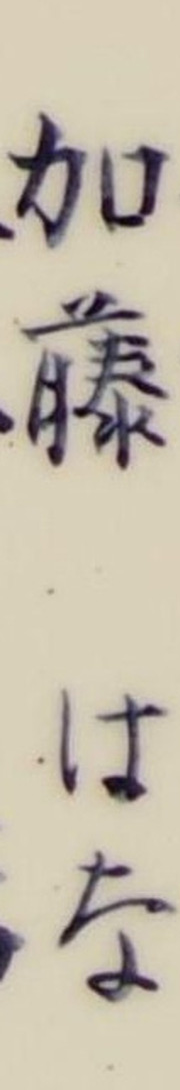加藤はな
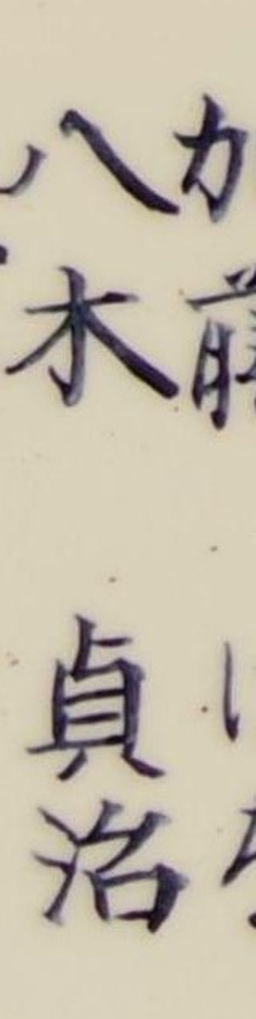八木貞治
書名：A~D
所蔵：koyasan kongobuji
